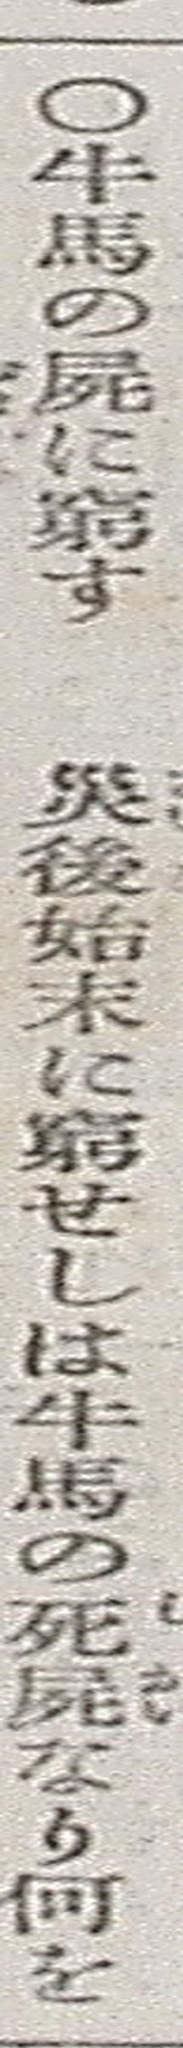○牛馬の屍に窮す災後始末に窮せしは牛馬の死屍なり何を
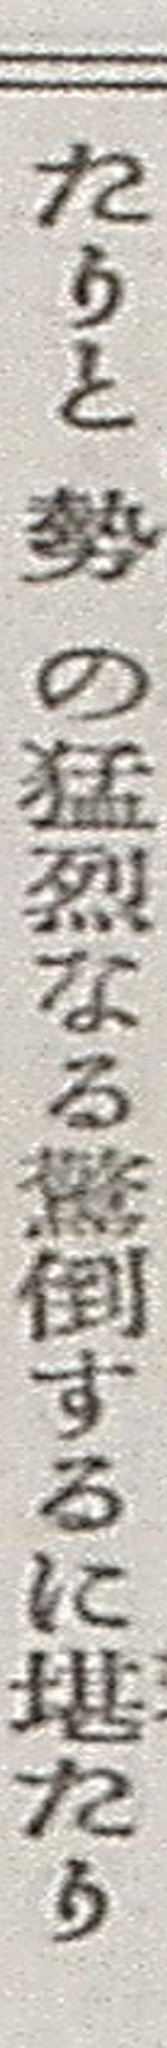たりと勢の猛烈なる驚倒するに堪たり
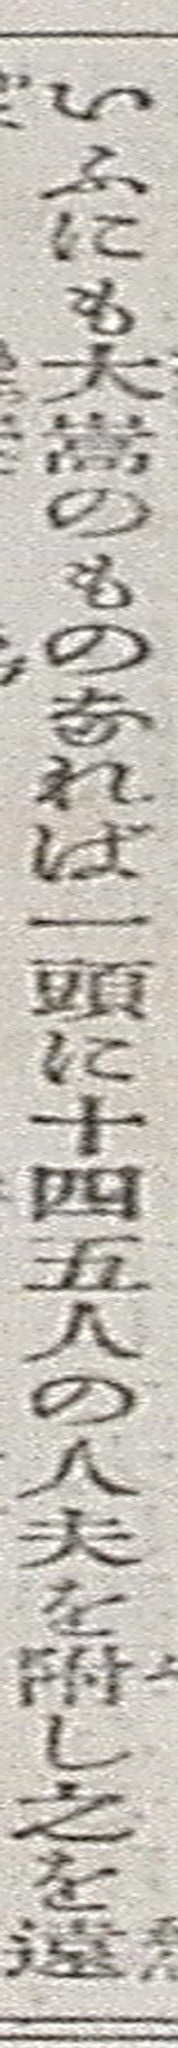いふにも大嵩のものなれば一頭に十四五人の人夫を付し之を遠
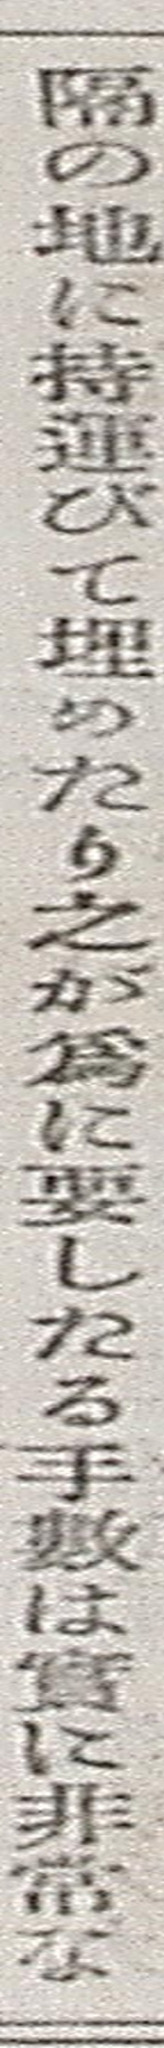隔の地に持運びて埋めたり之が為に要したる手数は実に非常な
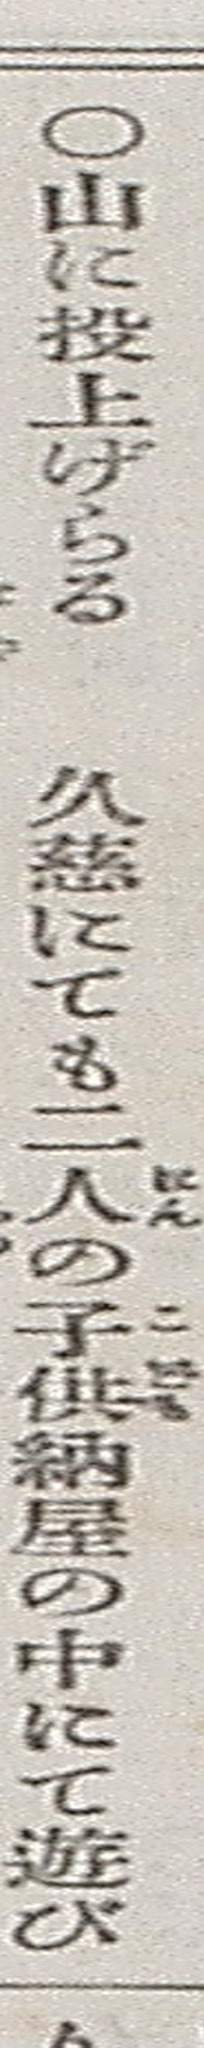○山に投上げらる久慈にても二人の子供納屋の中にて遊び
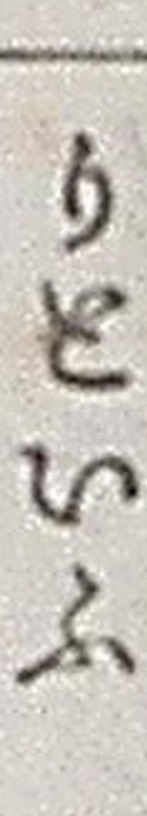りといふ
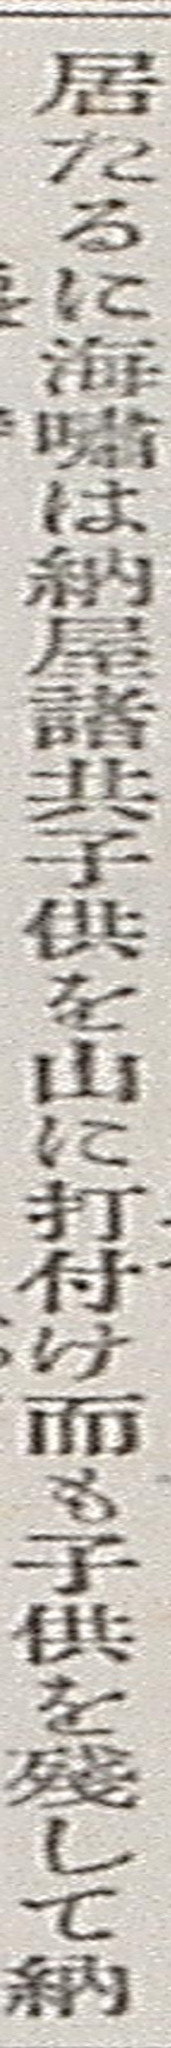居たるに海嘯は納屋諸共子供を山に打付け而も子供を残して納
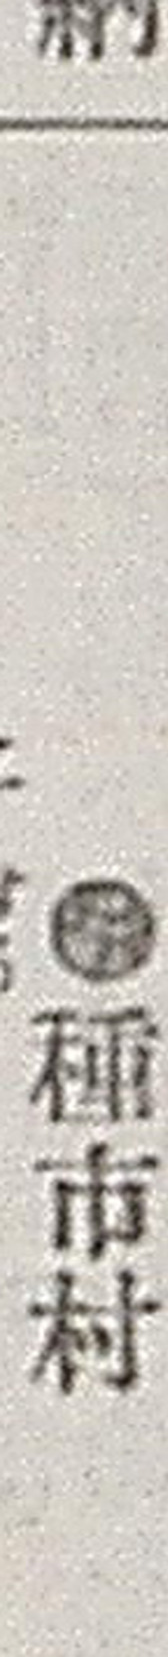●種市村
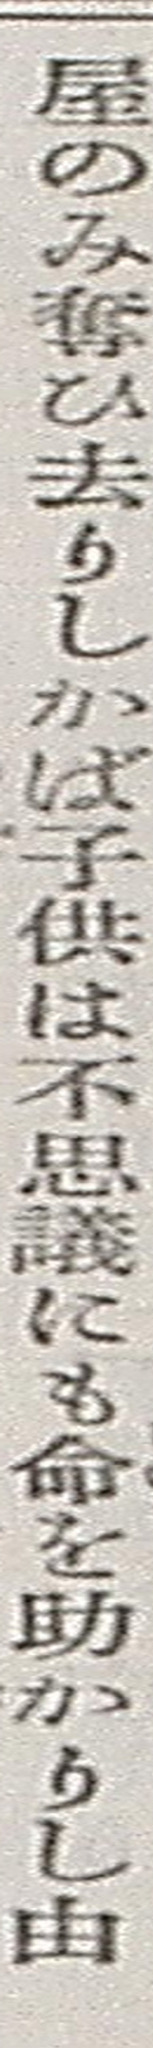屋のみ奪ひ去りしかば子供は不思議にも命を助かりし由
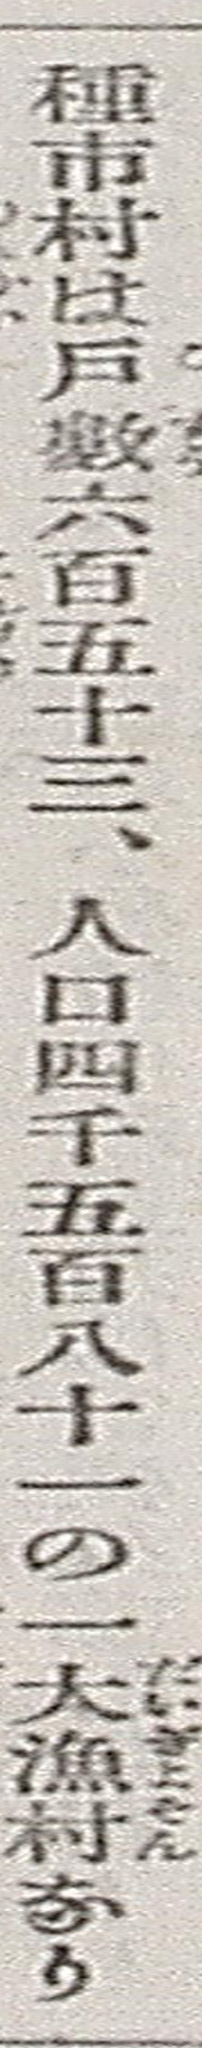種市村は戸数六百五十三、人口四千五百八十一の一大漁村なり
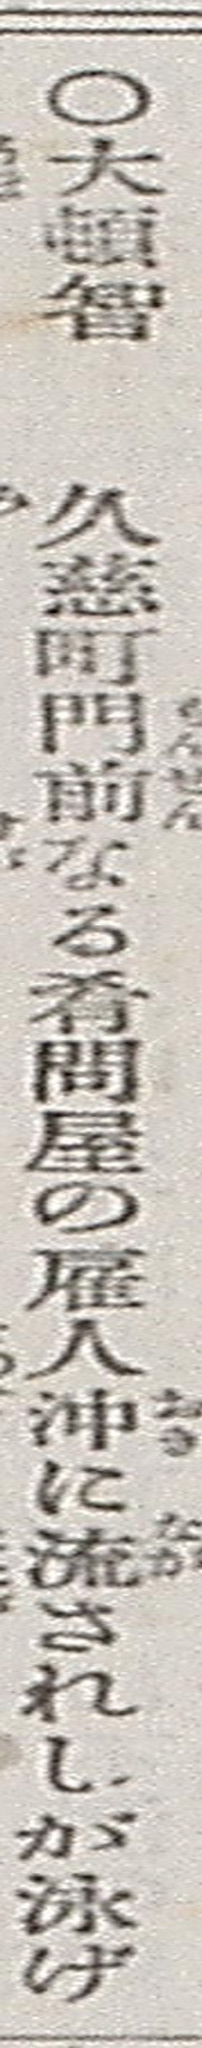○大頓智久慈町門前なる肴問屋の雇人沖に流されしが泳げ
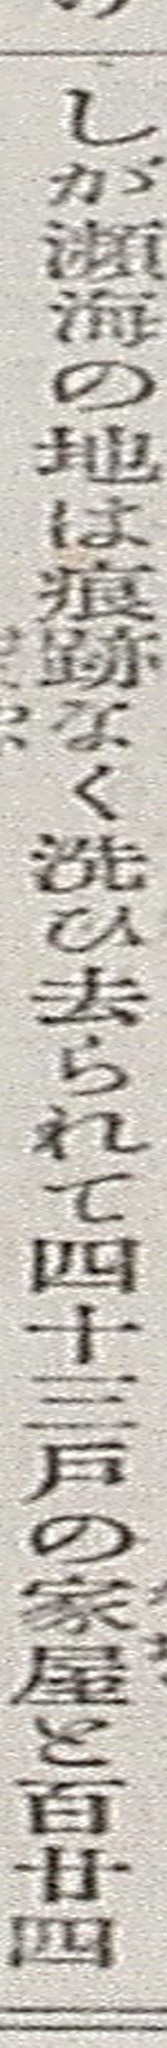しが瀕海の地は痕跡なく洗ひ去られて四十三戸の家屋と百廿四
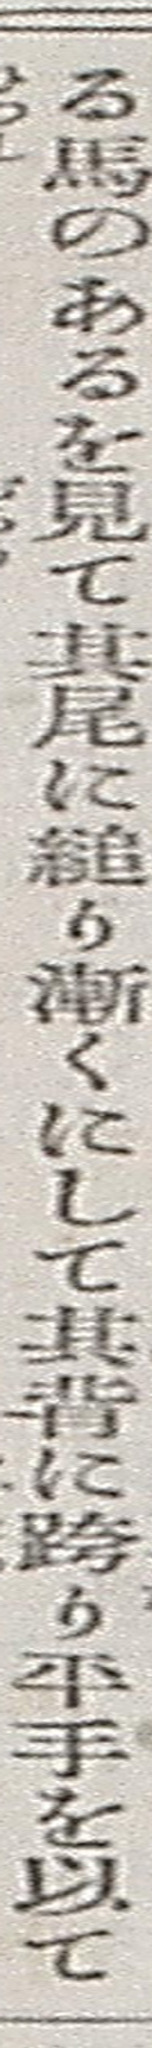る馬のあるを見て其尾に縋り漸くにして其背に跨り平手を以て
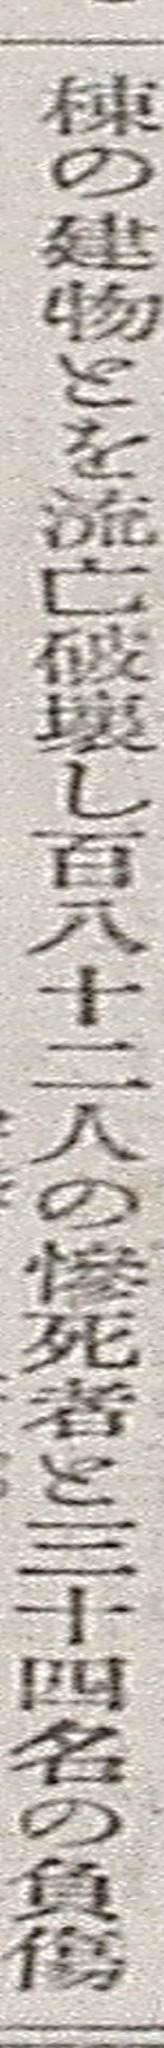棟の建物とを流亡破壊し百八十二人の惨死者と三十四名の負傷
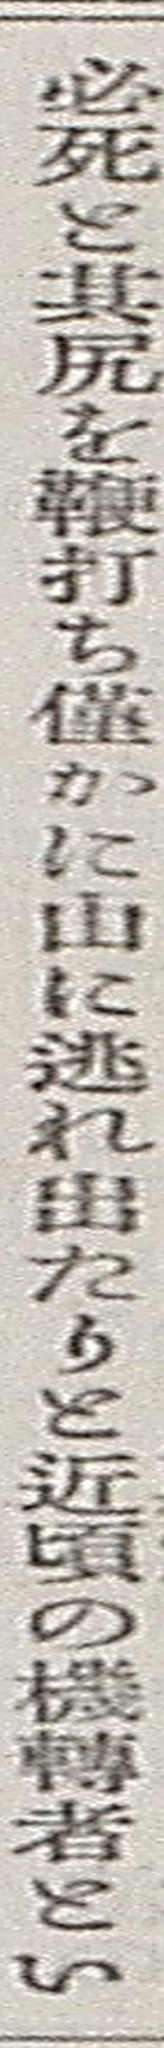必死と其尻を鞭打ち僅かに山に逃れ出たりと近頃の機転者とい
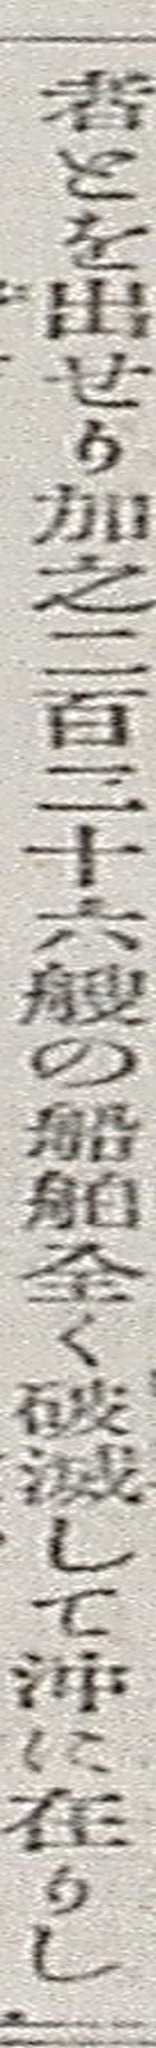者とを出せり加之ニ百二十六艘の船舶全く破滅して沖に在りし
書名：風俗畫報臨時増刊第百二十號　大海嘯被害録（下）
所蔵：東京大学地震研究所図書室 Earthquake Research Institute Library, The University of Tokyo, JAPAN
